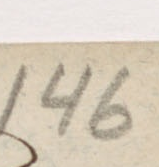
132.
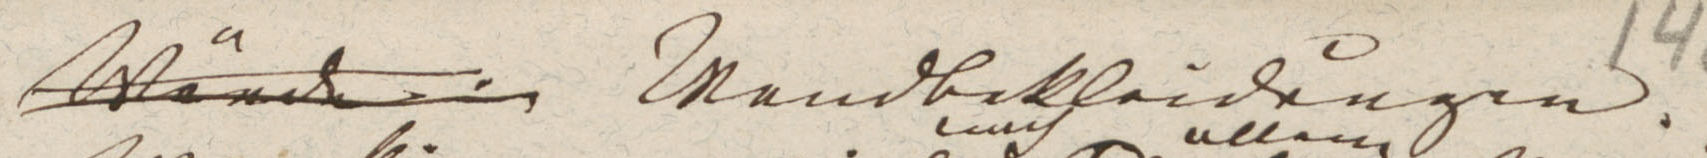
Wände Wandbekleidungen.
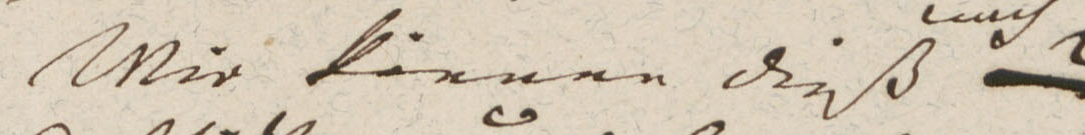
Wir können diess aus dem
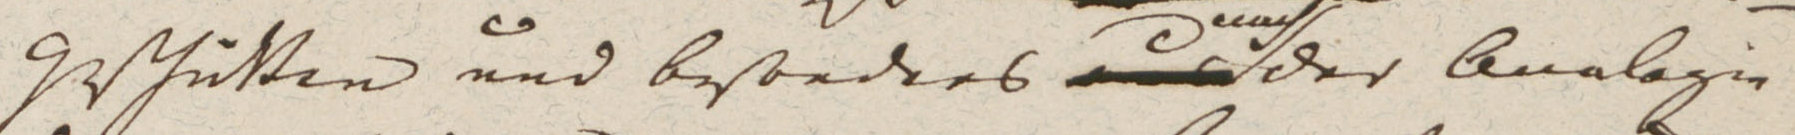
geschickten und besonders aus nach der Analogie
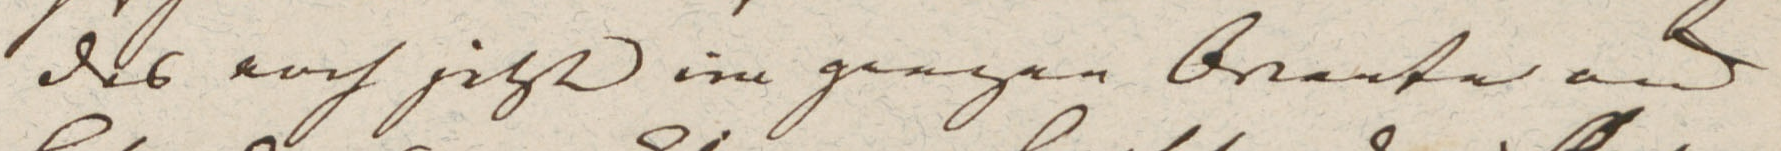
des noch jetzt im ganzen Oriente und
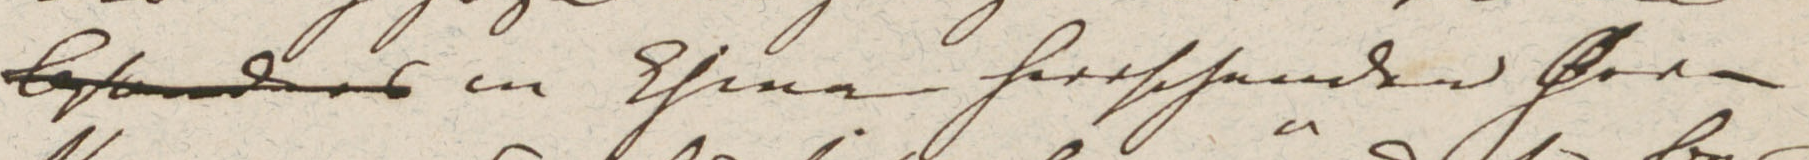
besonders in China herrschenden Her-
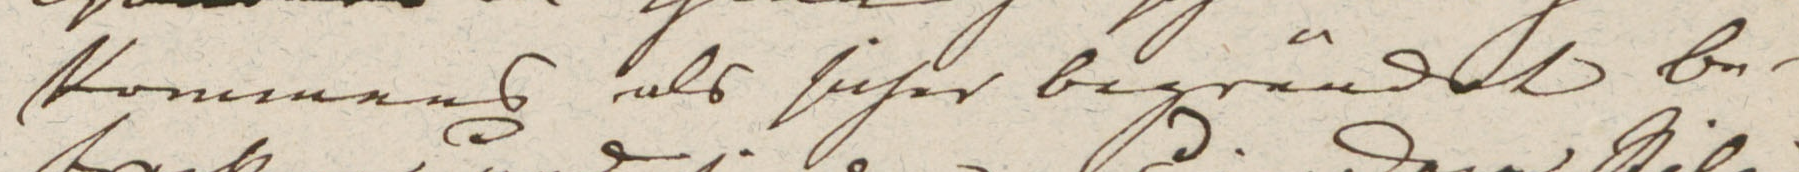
kommens als sicher begründet be-
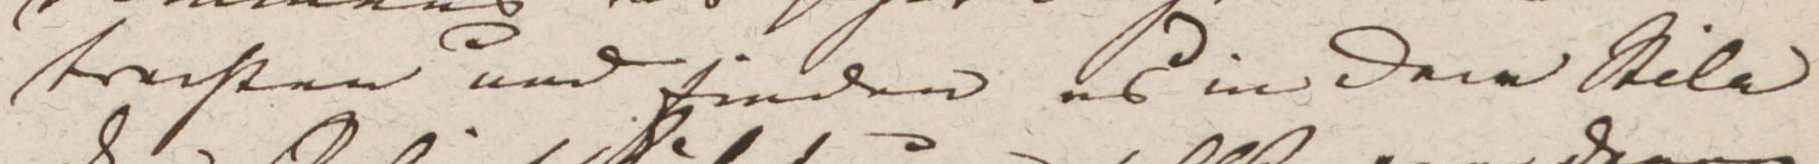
trachten und finden es in dem Stile
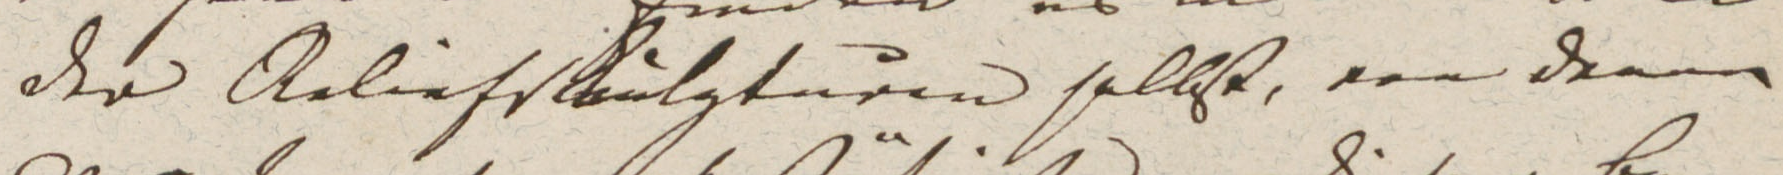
der Reliefskulpturen selbst, von denen
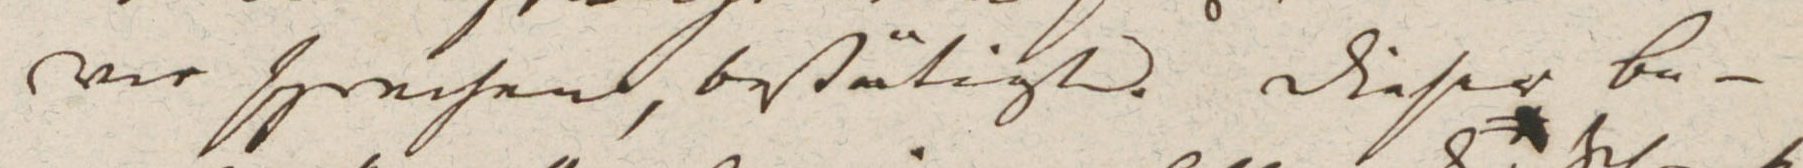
wir sprechen, bestätigt. Dieser be-
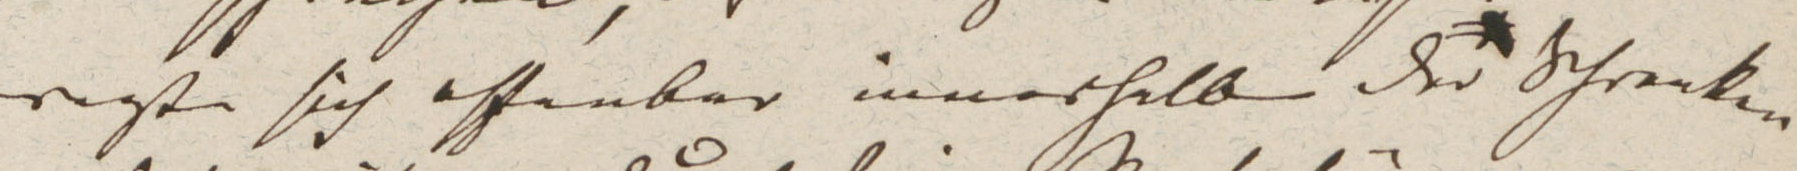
wegt sich offenbar innerhalb der % Schranken
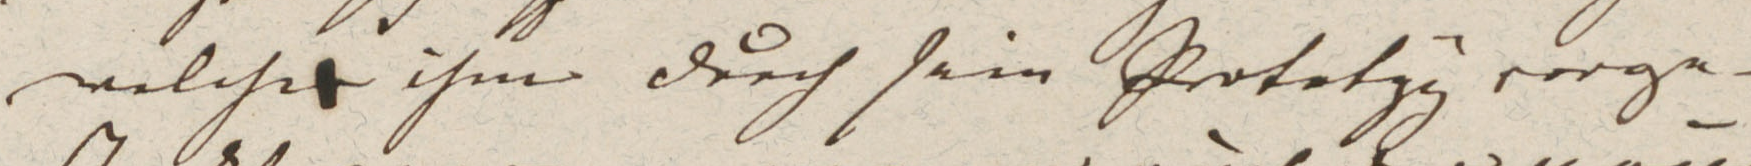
welcher ihm durch sein Prototyp vorge-
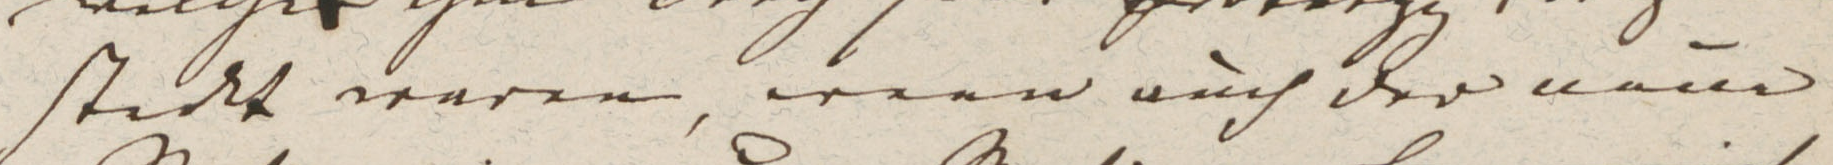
steckt waren, wenn auch der neue
